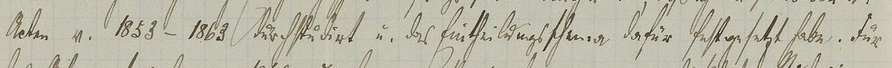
Acten v. 1853–1863 durchstudirt u. das Eintheilungsschema dafür festgesetzt habe. Für
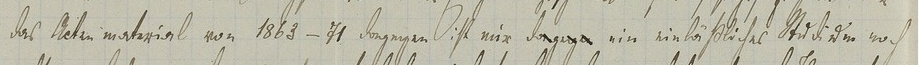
das Actenmaterial von 1863–71 dagegen ist mir dagegen ein einläßliches Studium noch
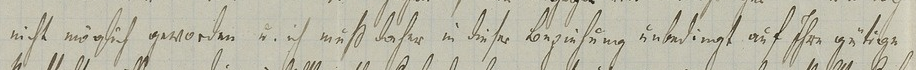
nicht möglich geworden u. ich muß daher in dieser Beziehung unbedingt auf Ihre gütige
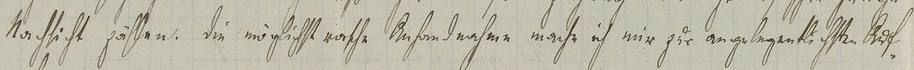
Nachsicht zählen. Die möglichst rasche Anhandnahme mache ich mir zur angelegentlichsten Auf-
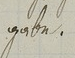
gabe.
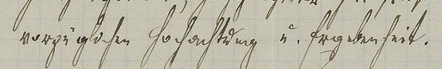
vorzüglichen Hochachtung u. Ergebenheit.
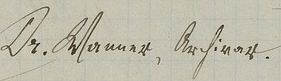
Dr. Wanner, Archivar.
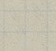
den
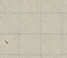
Juli
